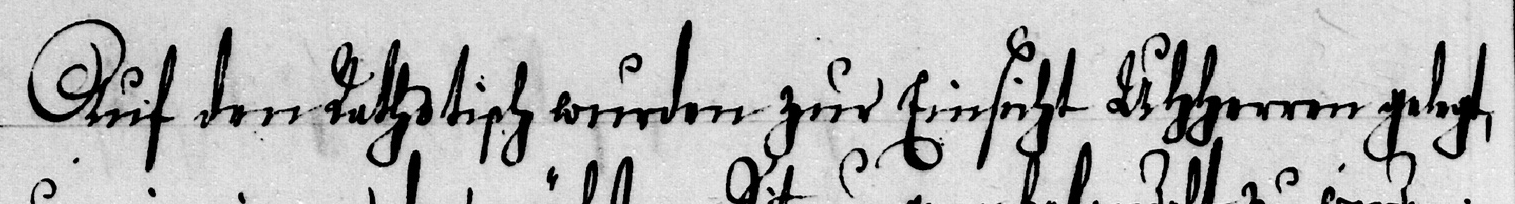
Auf den Rathstisch wurden zur Einsicht UHHerren gele¬
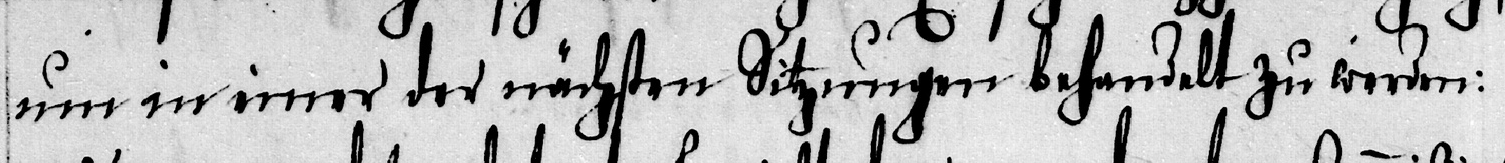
um in einer der nächsten Sitzungen behandelt zu werden:
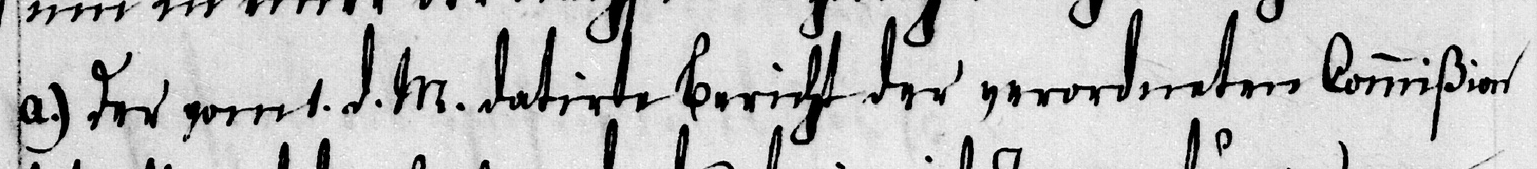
a.) Der vom 1. d. M. datirte Bericht der verordneten Commißion
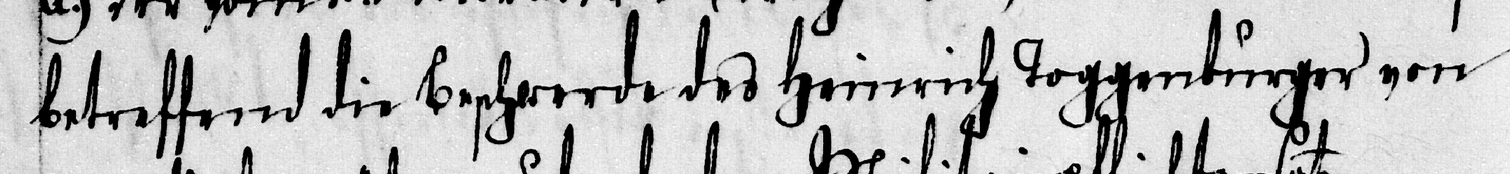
betreffend die Beschwerde des Heinrich Toggenburger von
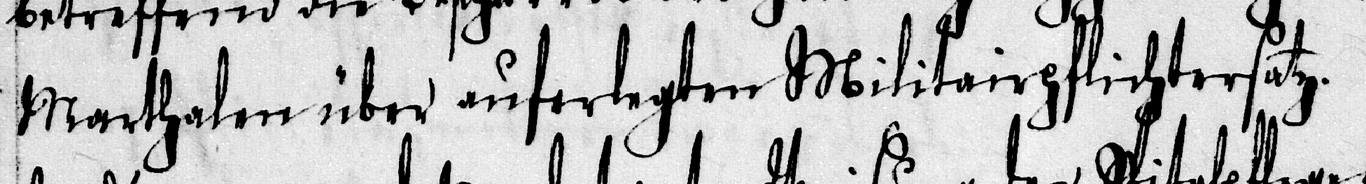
Marthalen über auferlegten Militairpflichtersatz.
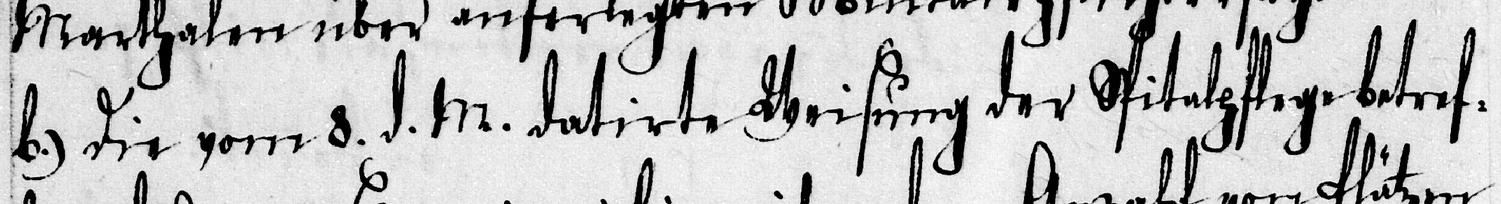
b.) Die vom 8. d. M. datirte Weisung der Spitalpflege betre¬
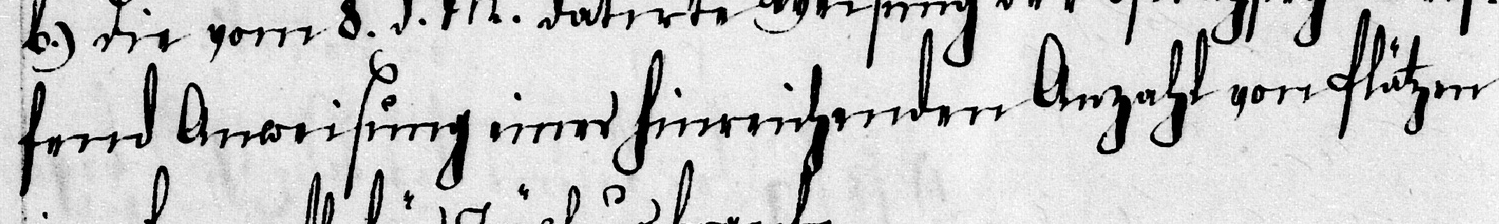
fend Anweisung einer hinreichenden Anzahl von Plätzen
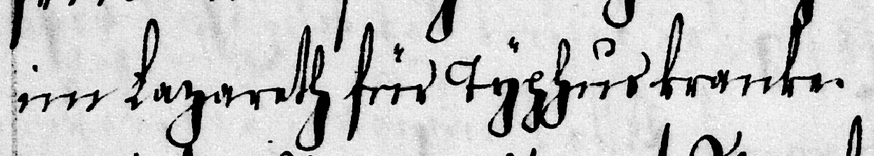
im Lazareth für Typhuskranke.
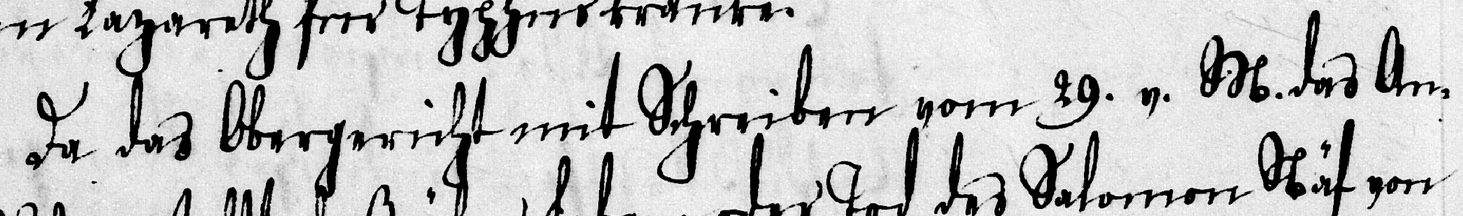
Da das Obergericht mit Schreiben vom 29. v. M. das An¬
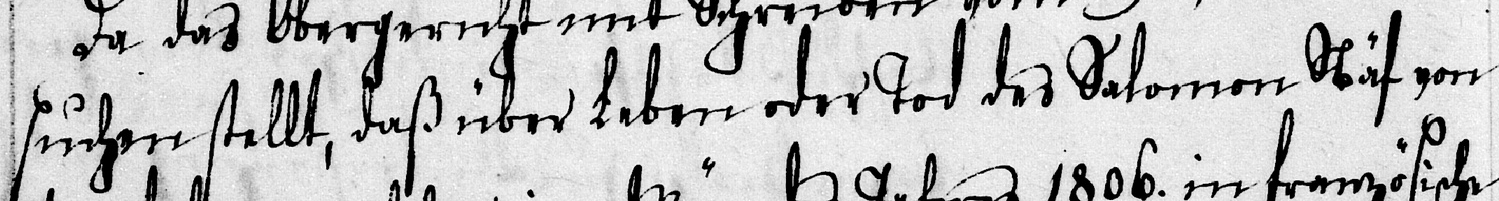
suchen stellt, daß über Leben oder Tod des Salomon Näf von
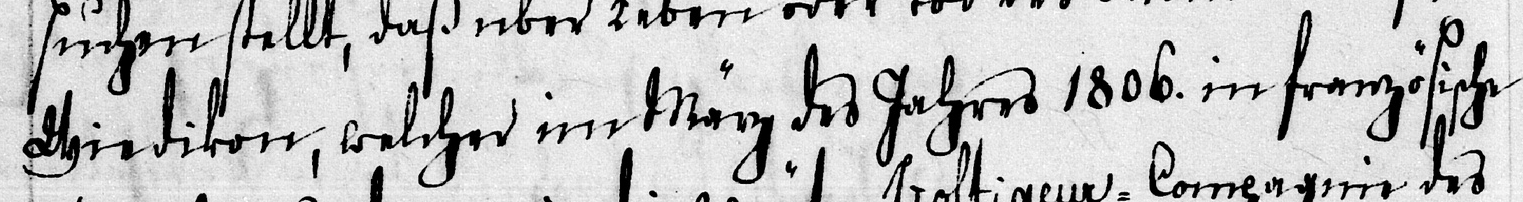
Wiedikon, welcher im März des Jahres 1806. in französische
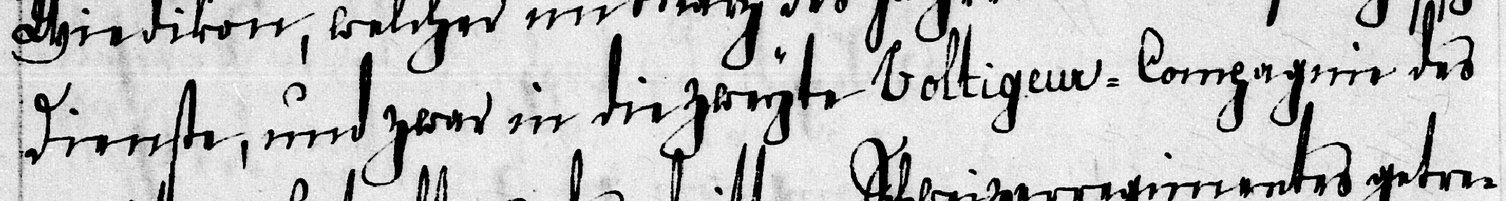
Dienste, und zwar in die zweyte Voltigeur-Compagnie des
